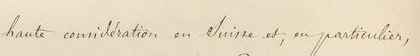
haute considération en Suisse et, en particulier,
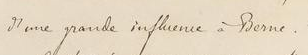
d'une grande influence à Berne.
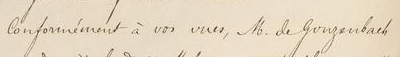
Conformément à vos vues, M. de Gonzenbach
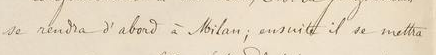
se rendra d'abord à Milan; ensuite il se mettra
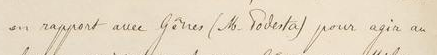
en rapport avec Gênes (M. Podesta) pour agir au
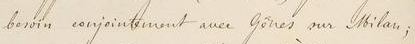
besoin conjointement avec Gênes sur Milan;
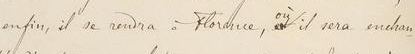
enfin, il se rendra à Florence, etoù il sera enchan-
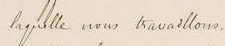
laquelle nous travaillons.
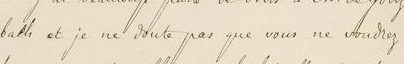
bach et je ne doute pas que vous ne voudrez
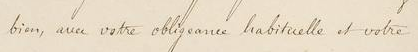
bien, avec votre obligeance habituelle et votre
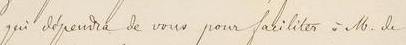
qui dépendra de vous pour faciliter à M. de
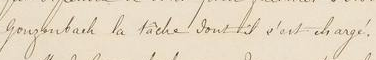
Gonzenbach la tâche dont il c'est chargé.
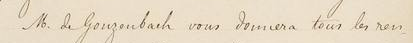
M. de Gonzenbach vous donnera tous le ren-
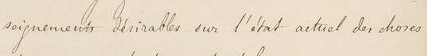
seignements désirables sur l'état actuel des choses
